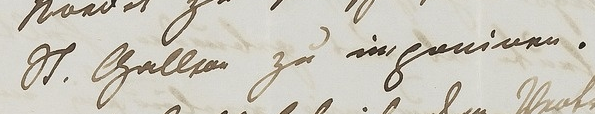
St. Gallern zu imponiren.
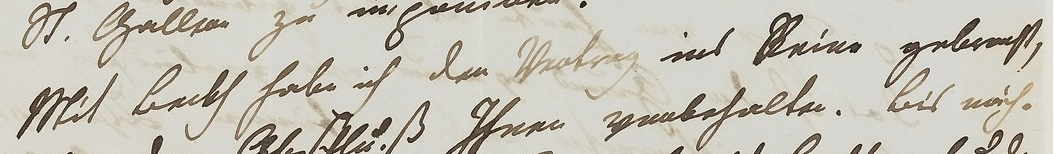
Mit Beckh habe ich den Vertrag ins Reine gebracht,
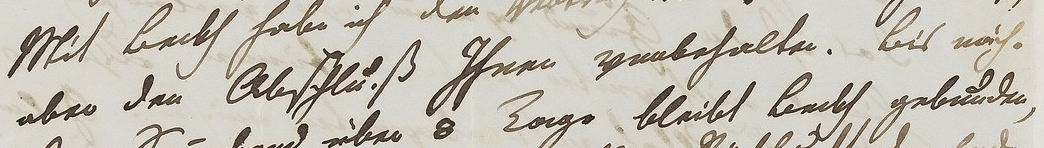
aber den Abschluß Ihnen vorbehalten. Bis näch-
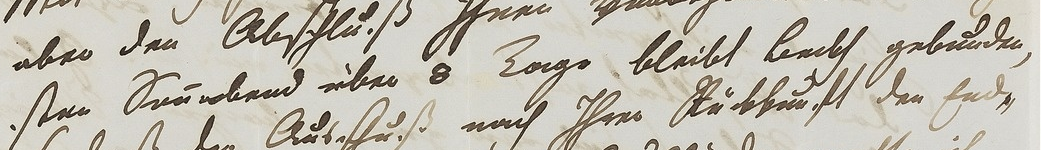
sten Sonnabend über 8 Tage bleibt Beckh gebunden,
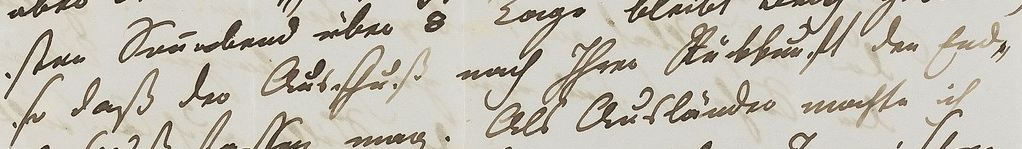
so daß der Ausschuß nach Ihrer Rückkunft den End-
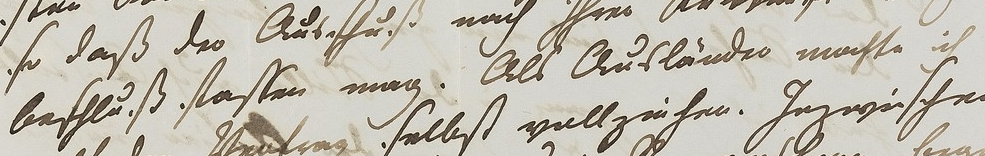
beschluß fassen mag. Als Ausländer mochte ich
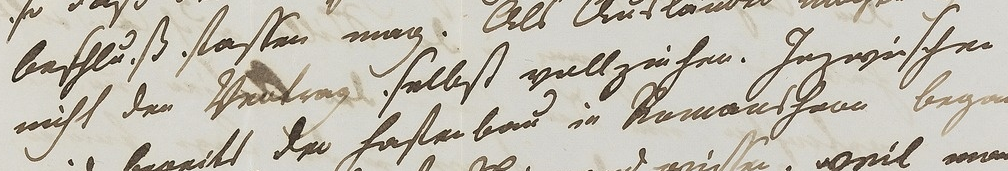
nicht den Vertrag selbst vollziehen. Inzwischen
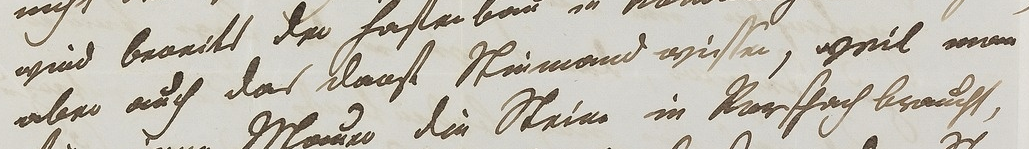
aber auch das darf Niemand wissen, weil man
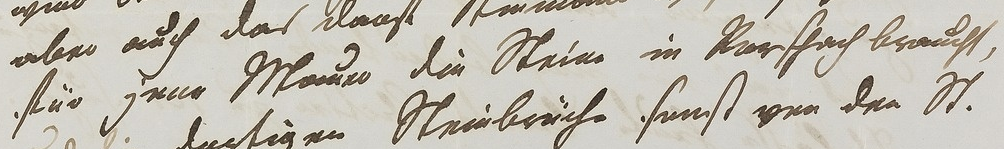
für jene Mauer die Steine in Rorschach braucht,
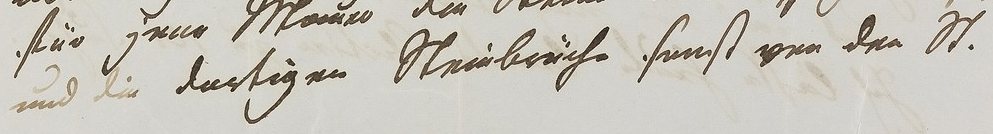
und die dortigen Steinbrüche sonst von den St.
